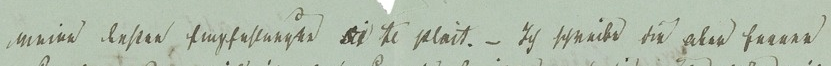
meine besten Empfehlungen si te plait. – Ich schreibe dir aber ferner
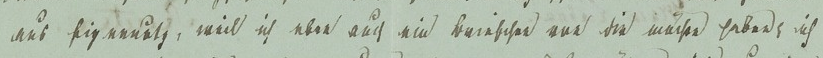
aus Eigennutz, weil ich eben auch ein Briefchen von dir möchte haben; ich
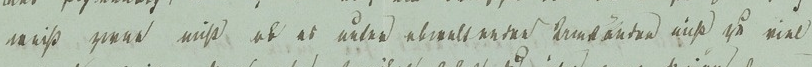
weiß zwar nicht ob es unter obwaltenden Umständen nicht zu viel
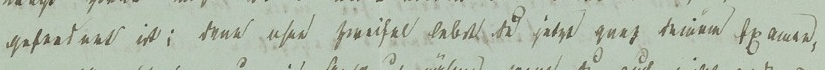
gefordert ist; denn ohne Zweifel lebst du jetzt ganz deinem Examen,
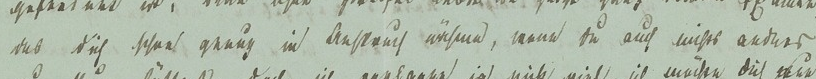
das dich schon genug in Anspruch nähme, wenn du auch nichts andres
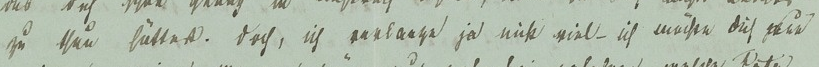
zu thun hättest. Doch, ich verlange ja nicht viel – ich möchte dich nur
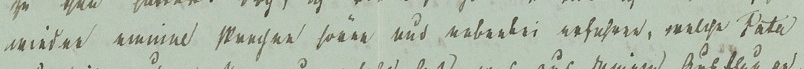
wieder einmal sprechen hören und nebenbei erfahren, welche Fata
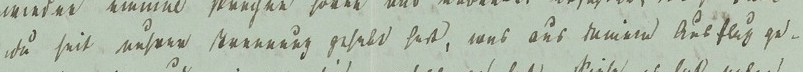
du seit unsrer Trennung gehabt hast, was aus deinem Ausflug ge-
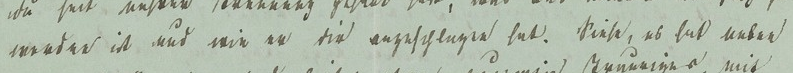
worden ist und wie er dir angeschlagen hat. Siehe, es hat neben
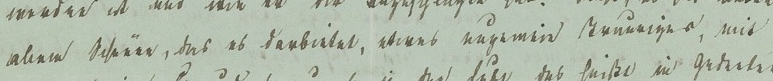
allem Schönen, das es darbietet, etwas ungemein Trauriges, mit
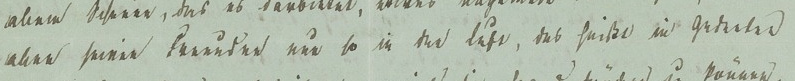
allen seinen Freunden nur so in der Luft, daß heißt in Gedanken
